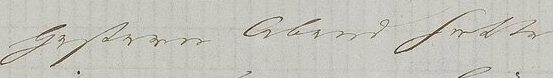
Gestern Abend hatte
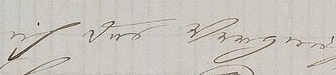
ich das Vergnügen,
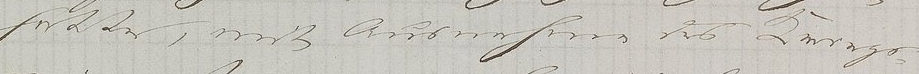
hatte, mit Ausnahme des Kriegs-
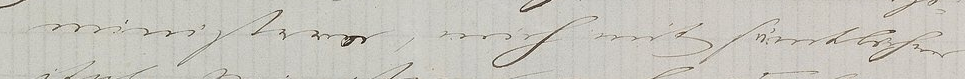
ministers, mich mit sämtlichen
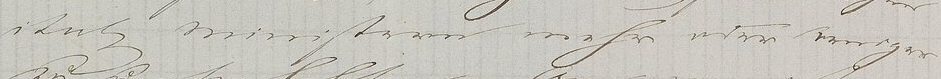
ital. Ministern mehr oder weniger
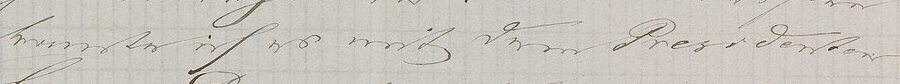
konnte ich es mit dem Presidenten
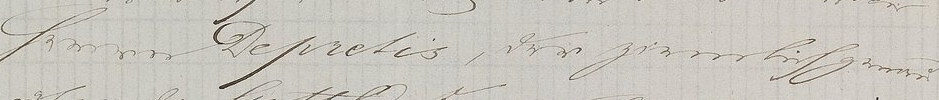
Herrn Depretis, der ziemlich genau
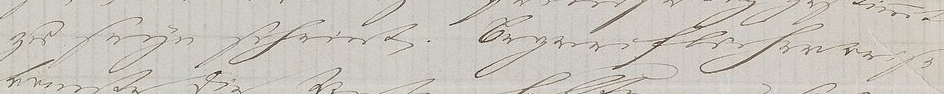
zu seyn scheint. Begreiflicherweise
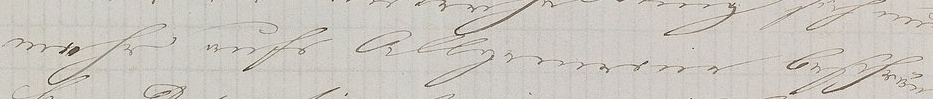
mehr aufs Allgemeine beschränken.
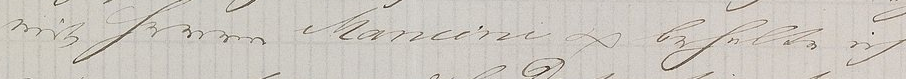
mit Herrn Mancini & behalte ich
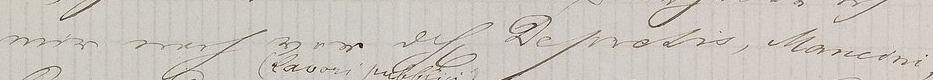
mir noch vor, d H. Depretis, Mancini,
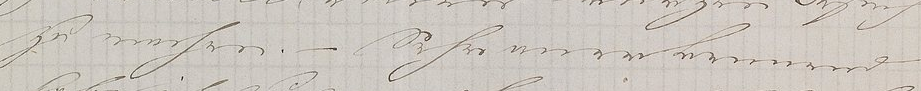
zu machen. – Sehr anerkennend
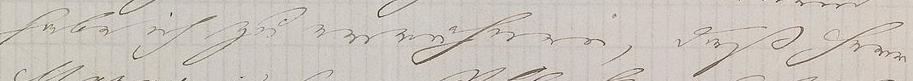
habe ich zu erwähnen, daß Herr
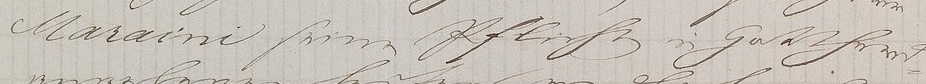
Maraini seine Pflicht in Gotthard -
